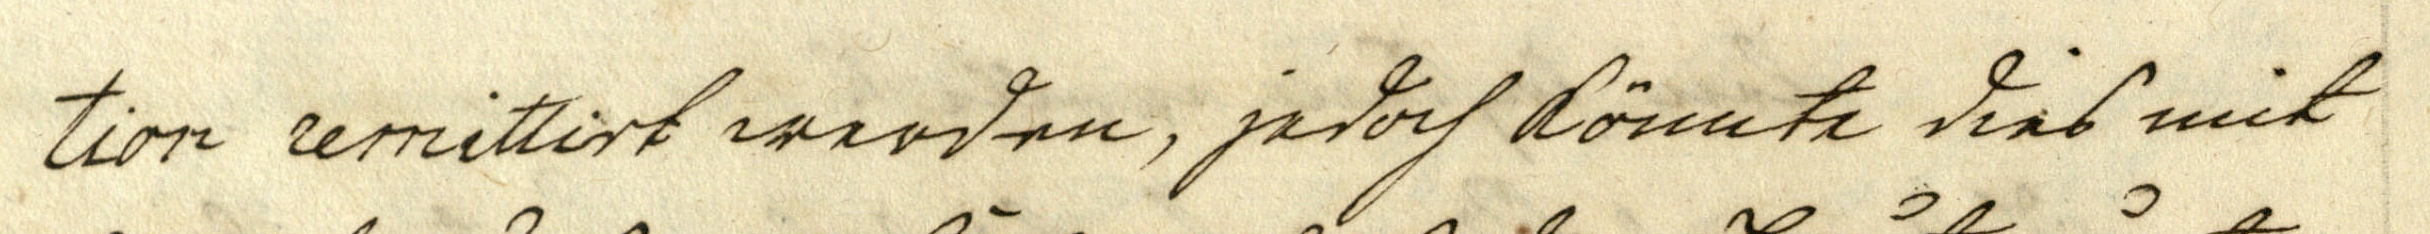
tion remittirt werden, jedoch könnte dies mit
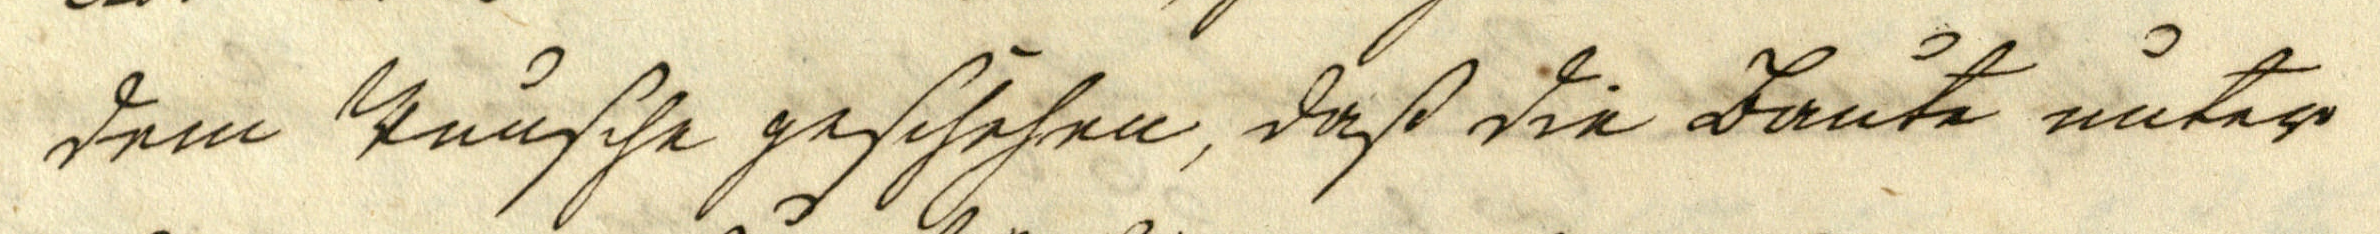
dem Wunsche geschehen, daß die Baute unter
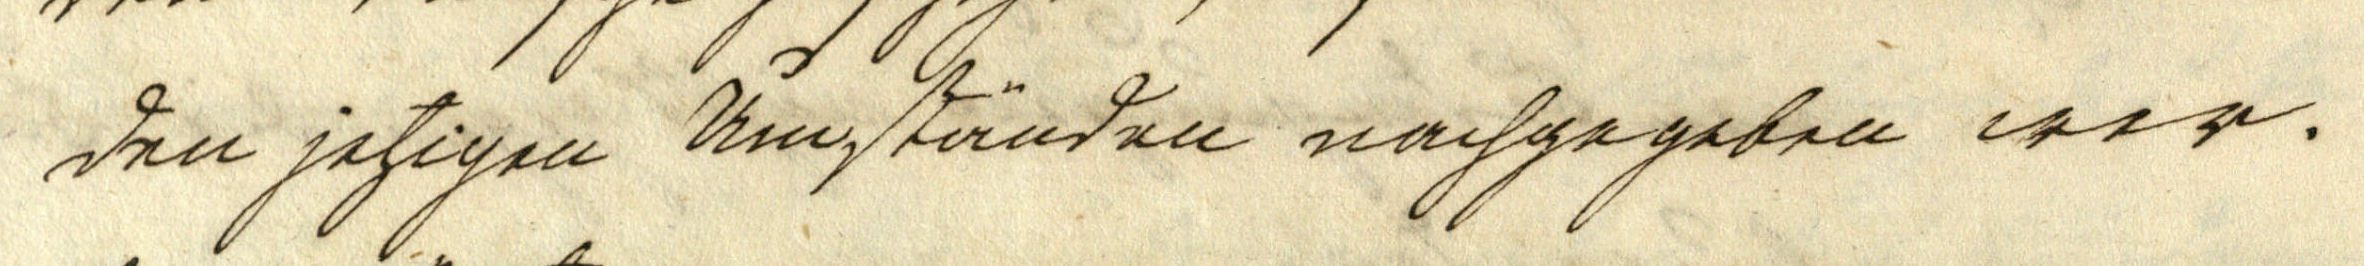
den jetzigen Umständen nachgegeben wer-
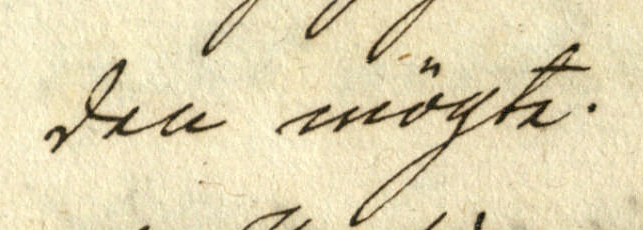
den mögte.
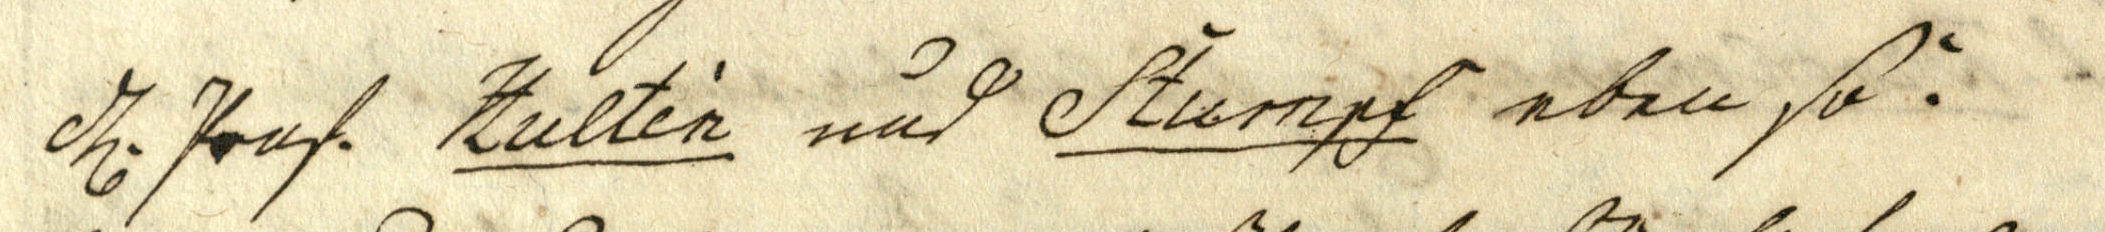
dh. Prof. Hultén und Stumpf ebenso
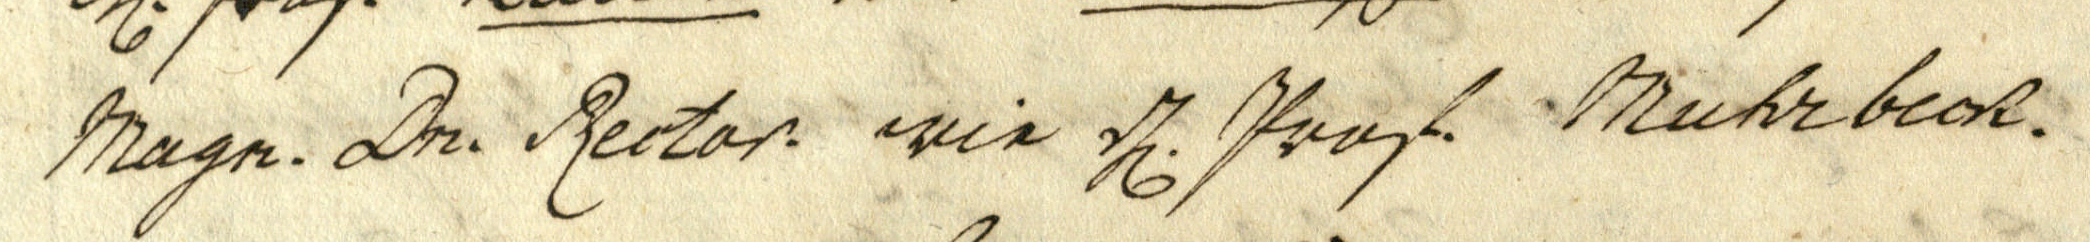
Magn. Dn. Recotr. wie dh. Prof. Muhrbeck.
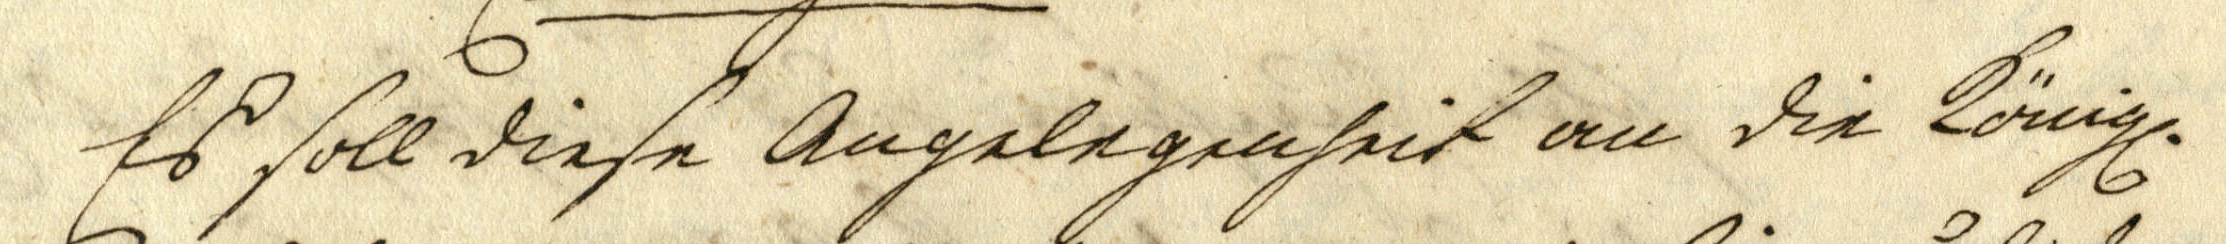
Es soll diese Angelegenheit an die Königl.
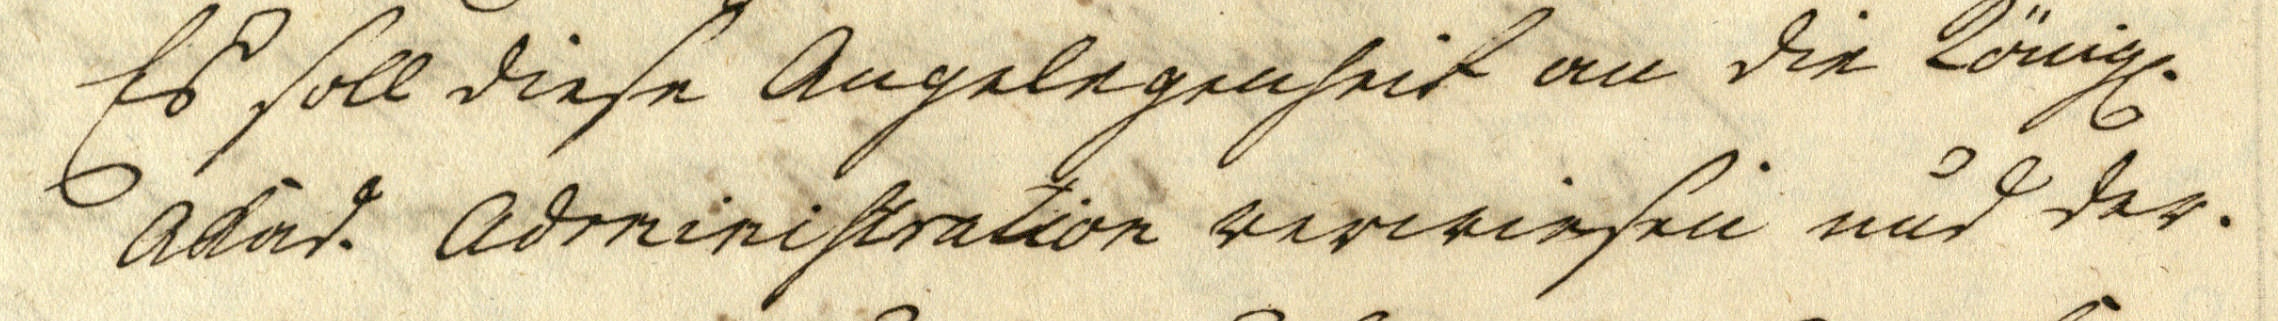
Akad. Administration verwiesen und der-
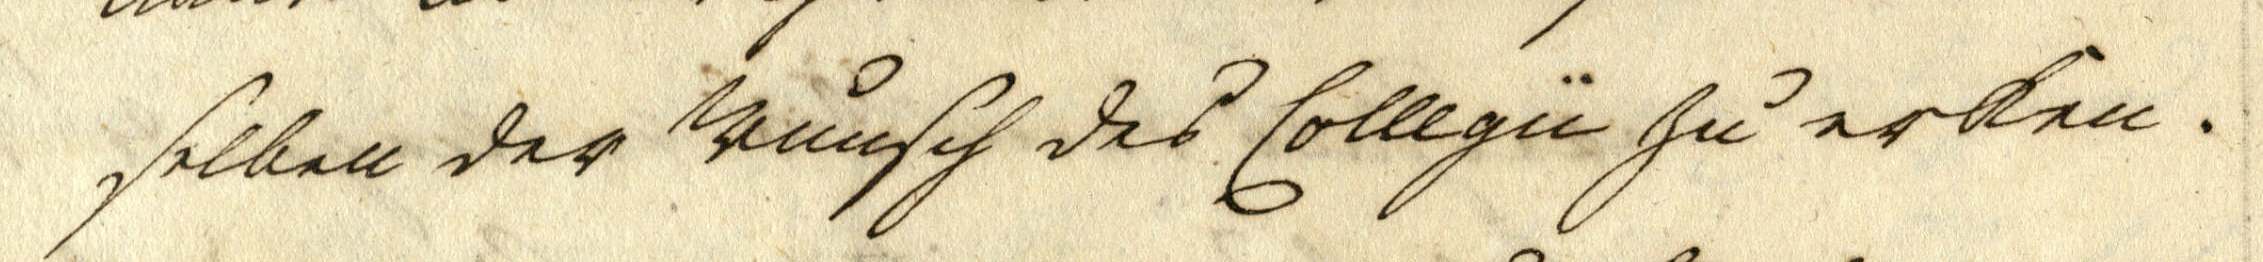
selben der Wunsch des Collegii zu erken-
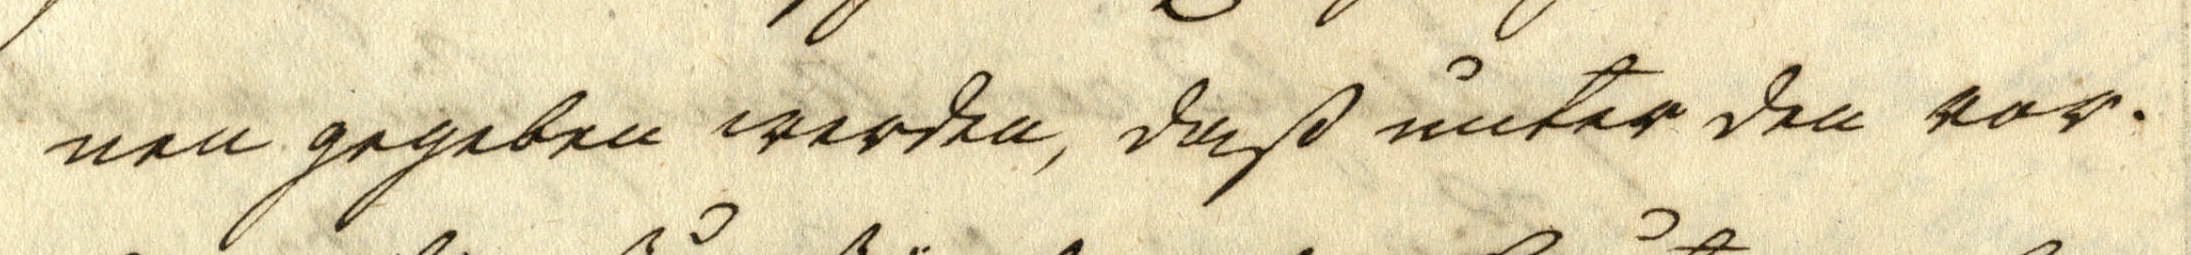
nen gegeben werden, daß unter den vor-
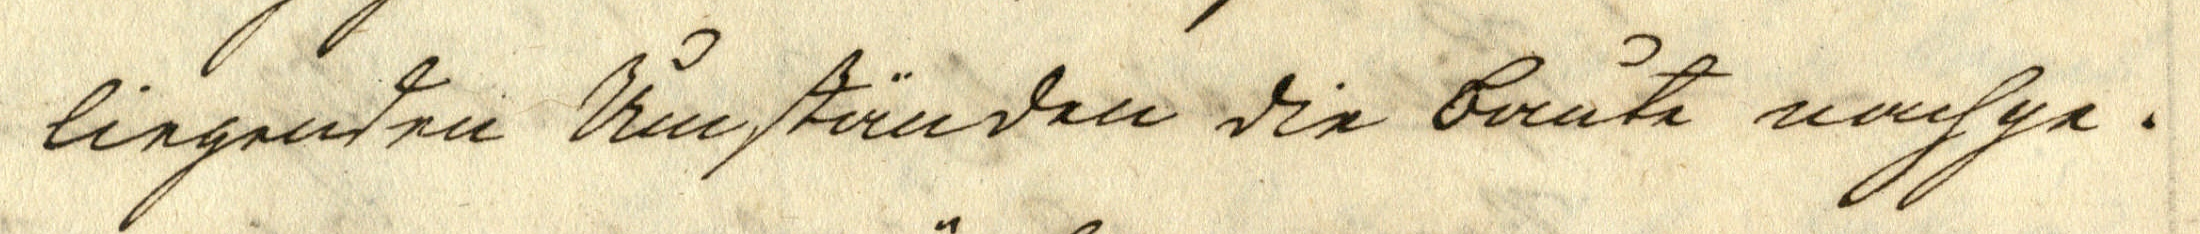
liegenden Umständen die Baute nachge-
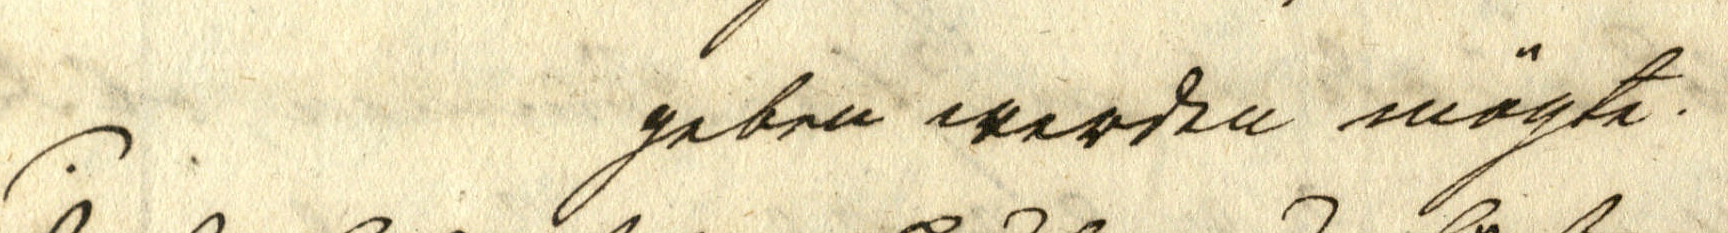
geben werden mögte.
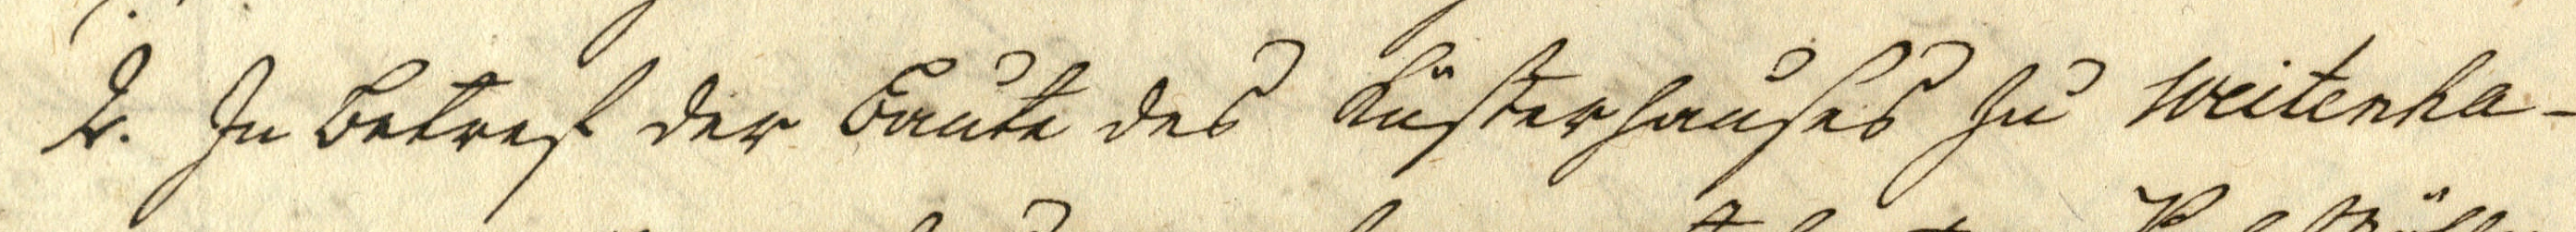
2. In betref der Baute des Küsterhauses zu Weitenha-
